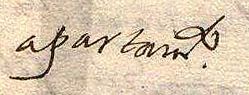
apartam.to
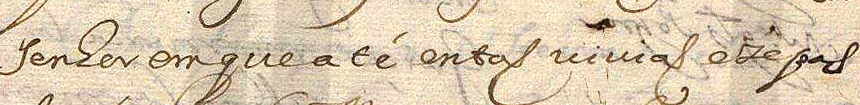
Senhor em que até entaõ uiuiaõ e se pas
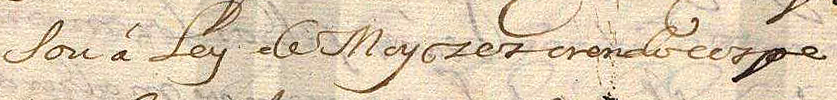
sou á Ley de Moyzes crendo e espe
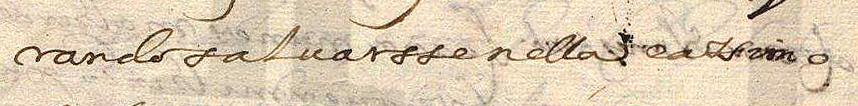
rando saluarsse nella e assim o
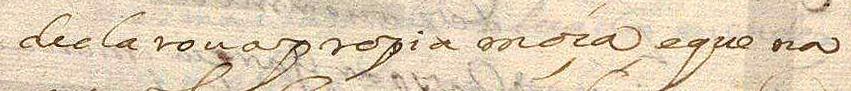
declarou a propia moça, e que na
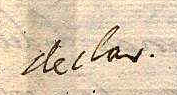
declar.
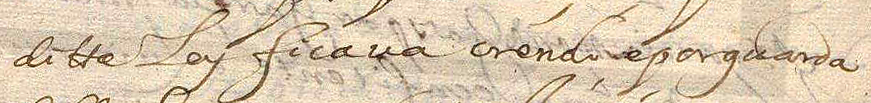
ditta Ley ficaua crendo e por guarda
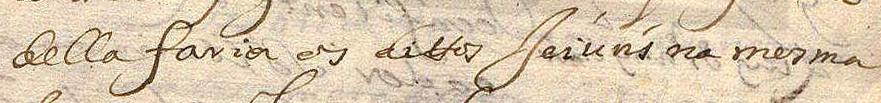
della faria os dittos Jeiuns na mesma
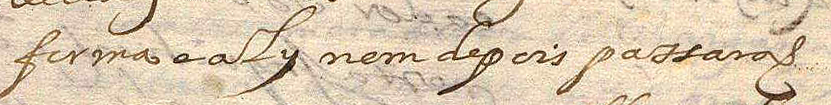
forma e aly nem depois passaraõ
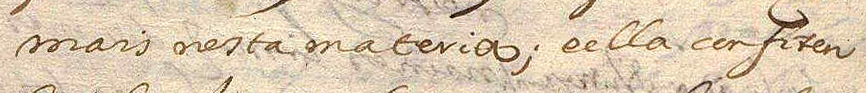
mais nesta materia; e ella confiten
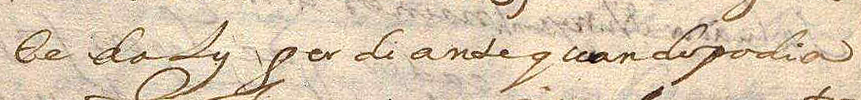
de daLy por diante quando podia
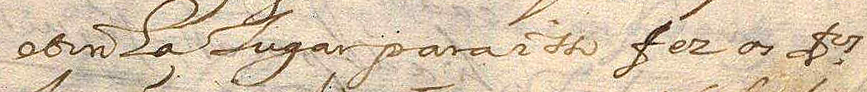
e tinha Lugar para isso fez os d.os
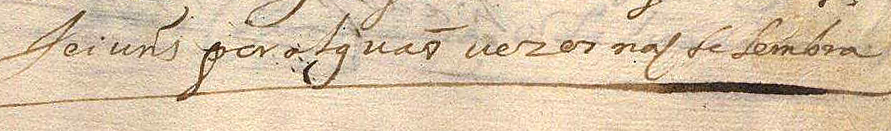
Jeiuns por alguās uezes naõ se lembra
